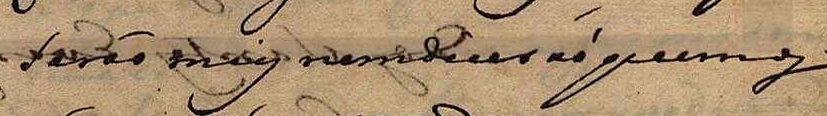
saraõ mais nem diceraõ quem os
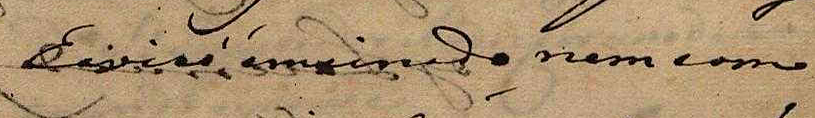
haviaõ emsinado, nem com
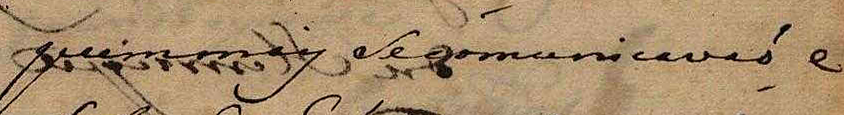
quem mais se comunicavaõ, e
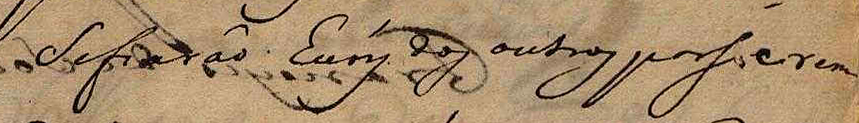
se fiaraõ huns dos outros por serem
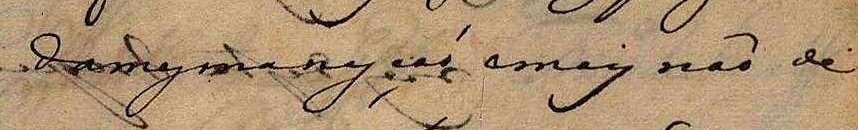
da mesma nasçaõ e mais naõ di
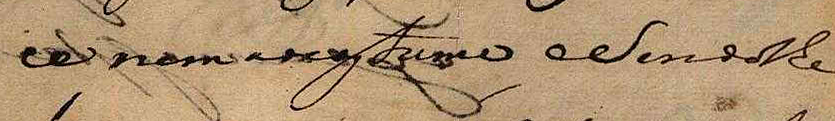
ce nem ao costume, e Sendo lhe
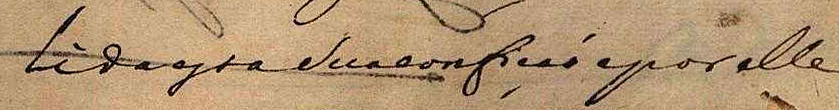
Lida esta sua confiçaõ e por elle
